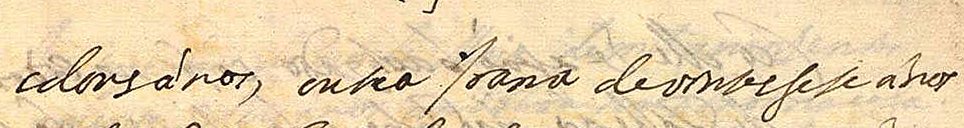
E dous ānos, outra Joana de vinte e sete ānos
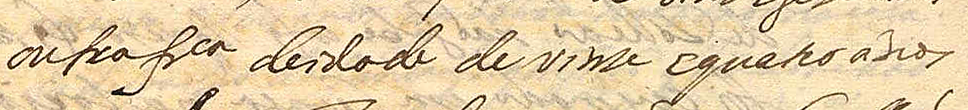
outra frca de idade de vinte e quatro ānos
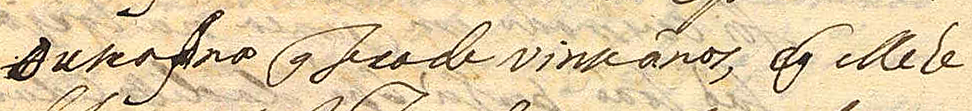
Outra Ana q̄ sera de vinte ānos, e q̄ elle he
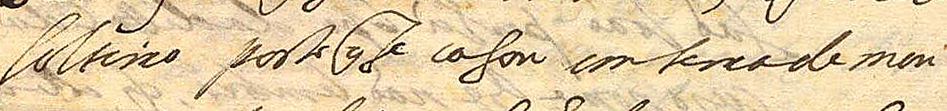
solteiro posto q̄ se casou em terra de mou
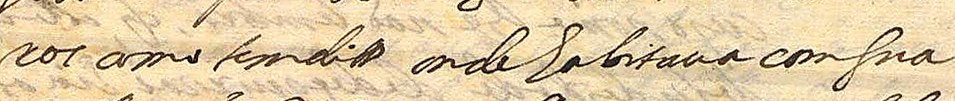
ros como tem dito onde habitaua com sua
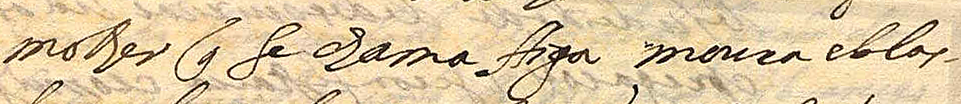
molher q̄ se chama Aiga moura e blas
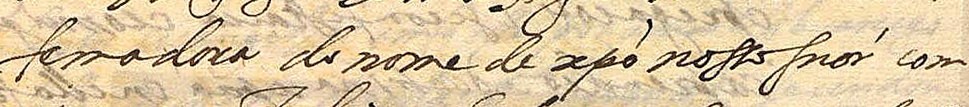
femadora do nome de xpō nosso snor̄ com
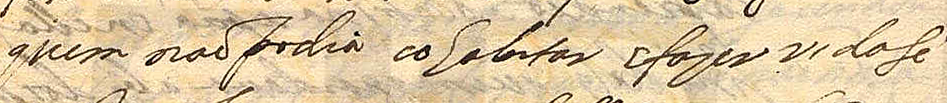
quem naõ podia cohabitar e fazer vida sē
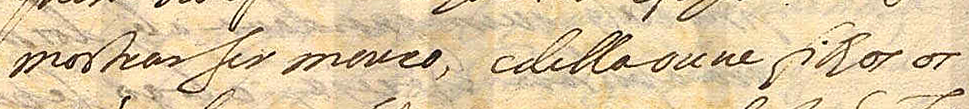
mostrar ser mouro, e della ouue filhos os
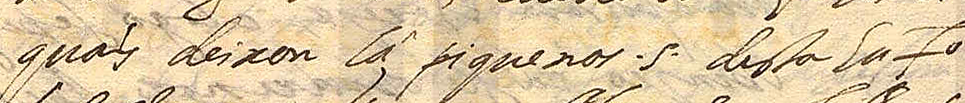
quais deixou lá piquenos .s. desta hū fo
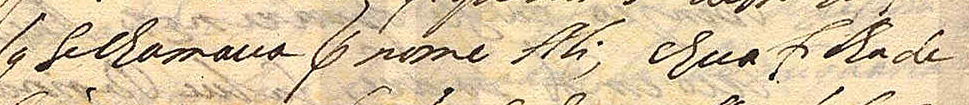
q̄ se chamaua p̄ nome Ali, e hua filha de
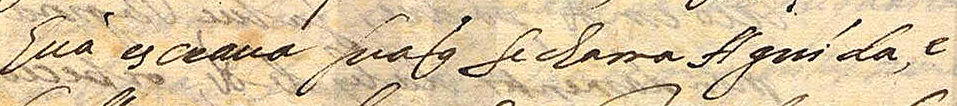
huā escraua sua q̄ se chama Aguida, e
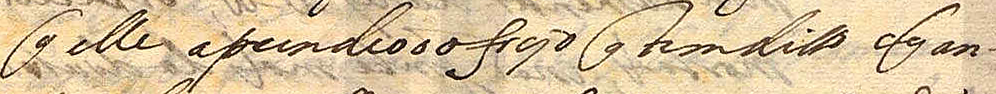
q̄ elle aprendeo o oficjo q̄ tem ditto e q̄ an
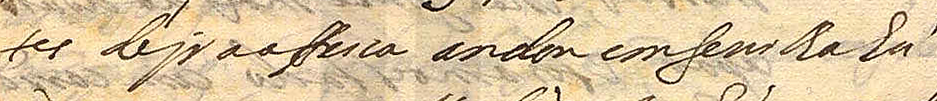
tes de jr a affrica andou em seuilha hū
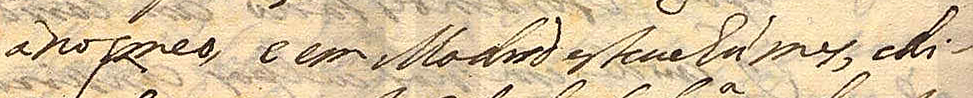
ano e meo, e em Madrid esteue hū mes, e di
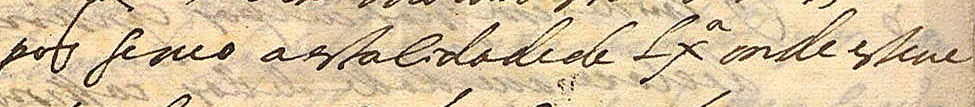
pos̄ se ueo a esta cidade de Lxa onde esteue
